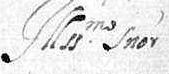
Ilss.mo Snor̄
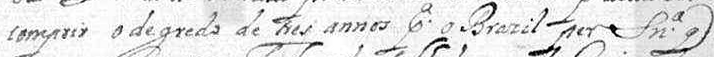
cumprir o degredo de tres annos p.a o Brazil pera Sn.a q̄
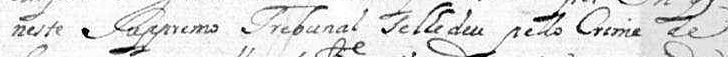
neste Suppremo Tribunal se lhe deu pello Crime de
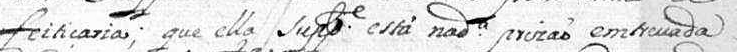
feitiçaria; que ella supp.te está na d.a prizaõ emtreuada
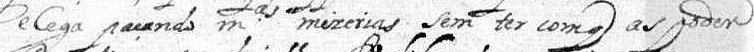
e cega paçando m.tas mizerias sem ter com q̄ as poder
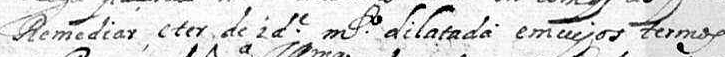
Remediar e ter de id.e m.to dilatada em cujos termos
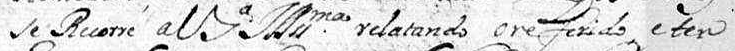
se Recorre a V Sa. Illss.ma relatando o referido, e ten
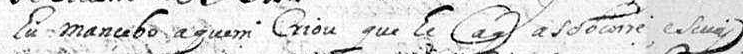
hū mancebo a quem Criou que he a q̄ a sobcorre e se uaj
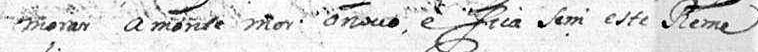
morar a montemor o nouo, e fica sem este Reme
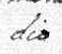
dio
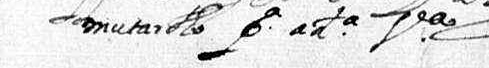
mutarlho p.a a d̄.a V.a
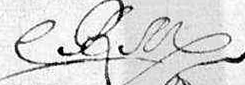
E R M
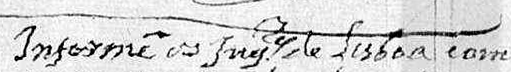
Informē os Jnqres de Lisboa com
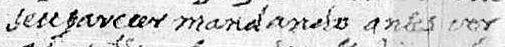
seu parecer mandando antes ver
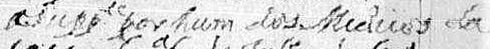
a suppte per hum dos Medicos da
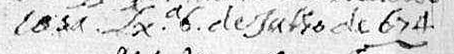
casa Lx.a 6. de Julho de 674
